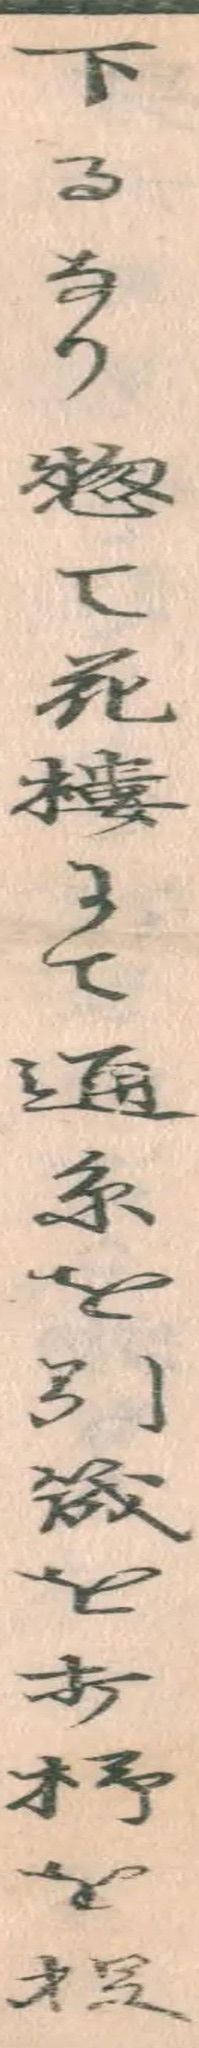下るなり惣て花楼にて通糸を引筬を打杼を投
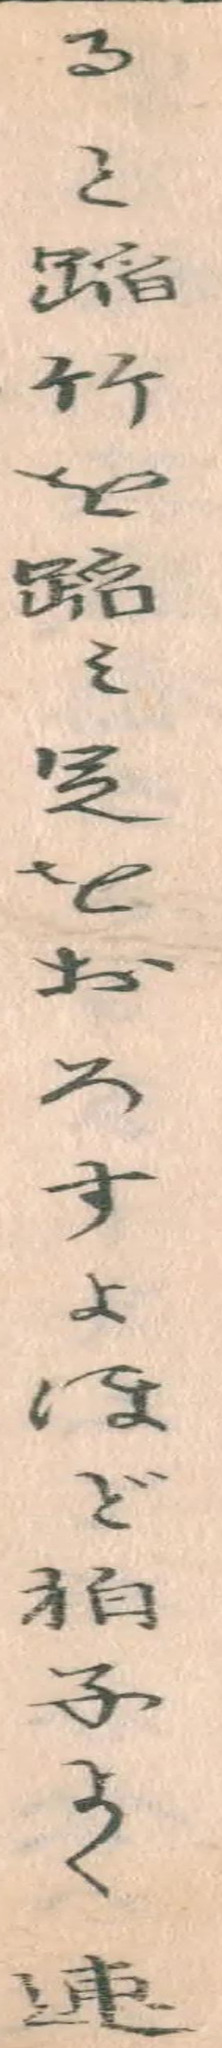ると蹈竹を蹈み足をおろすよほど拍子よく連
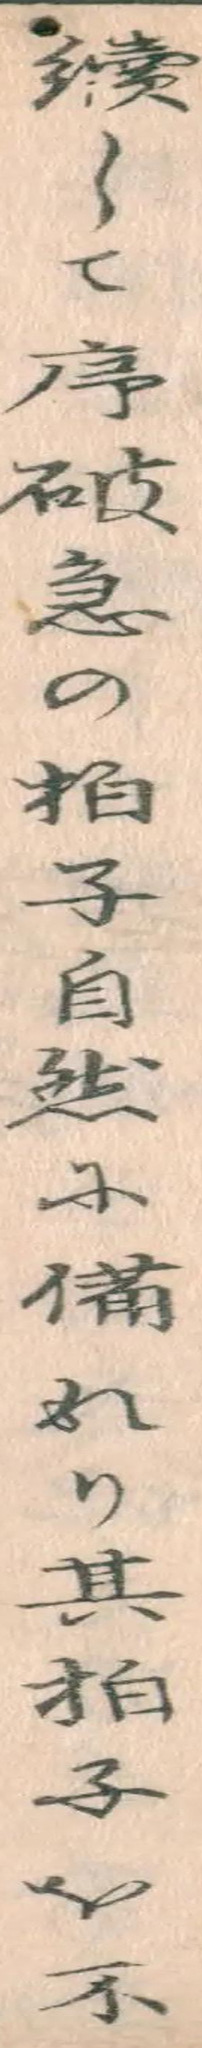続して序破急の拍子自然に備れり其拍子を不
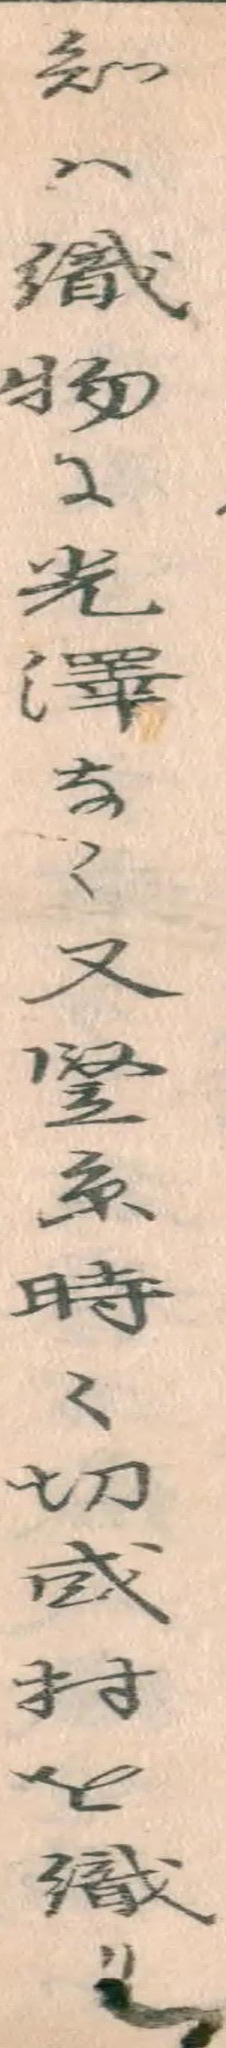知は織物に光沢なく又竪糸時々切或村を織り
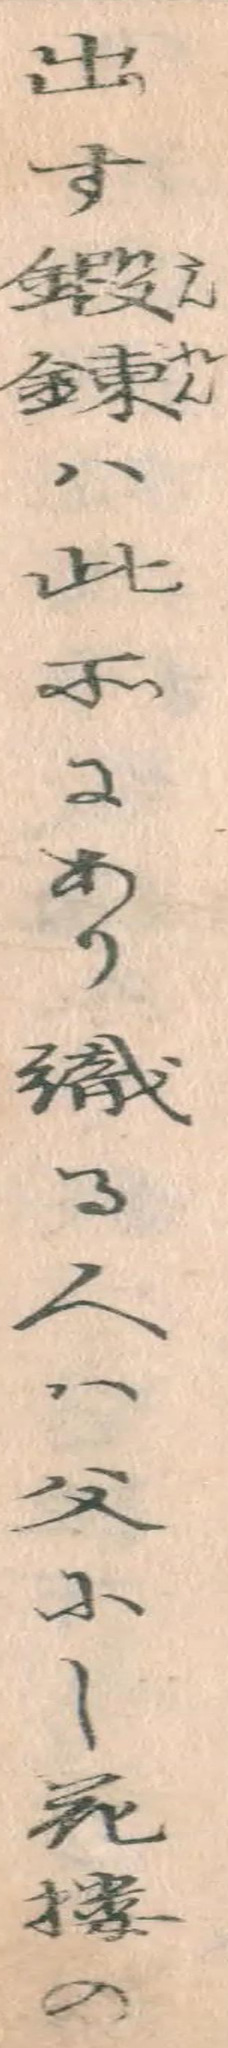出す鍛錬は此所にあり織る人は父にし花楼の
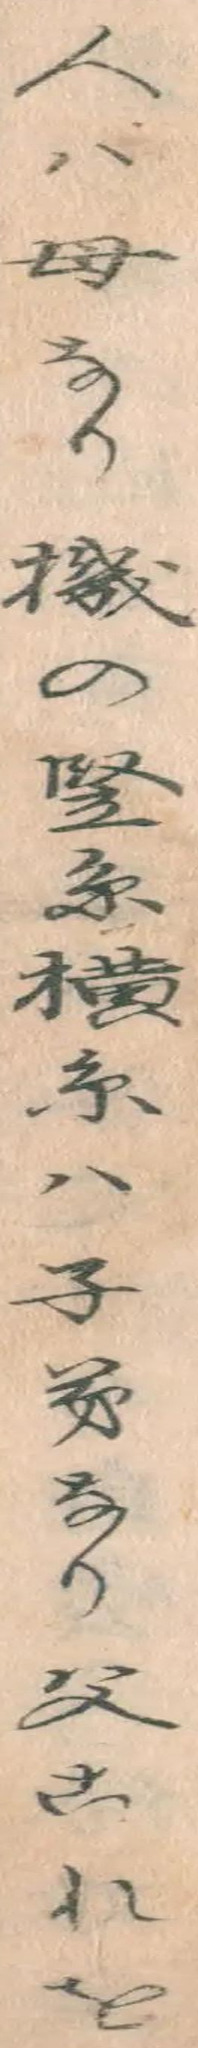人は母なり機の竪糸横糸は子弟なり父これを

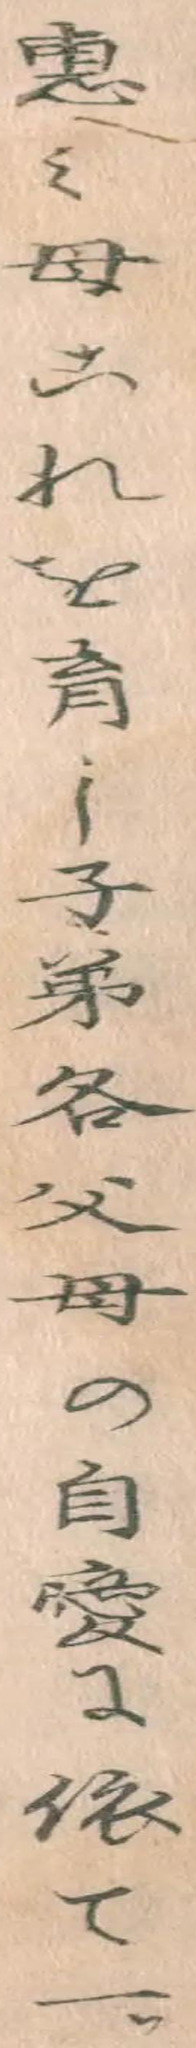恵み母これを育し子弟各父母の自愛に依て一ッ
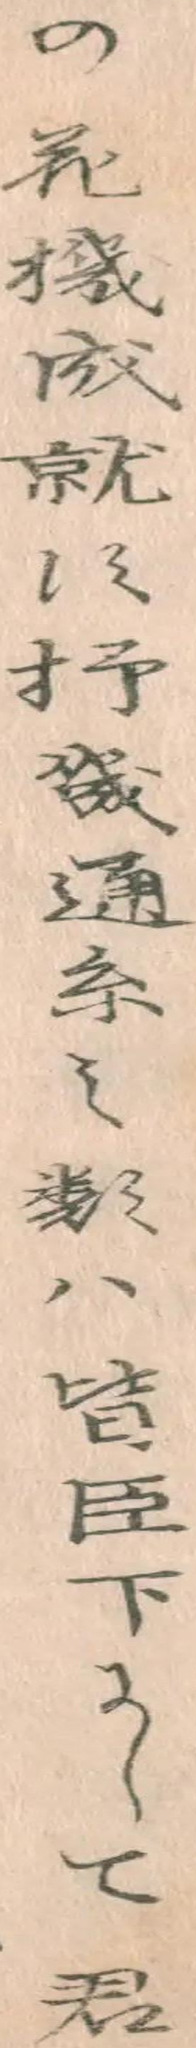の花機成就す杼筬通糸之類は皆臣下にして君
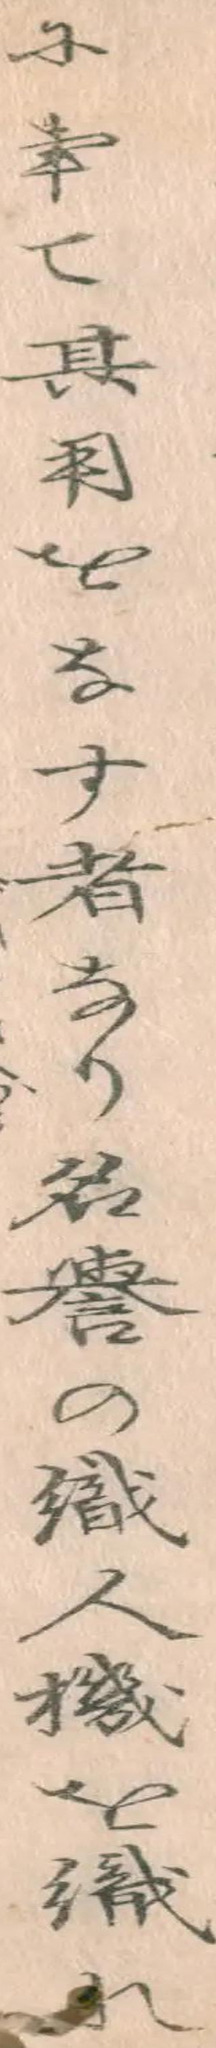に事て其用をなす者なり名誉の織人機を織れ
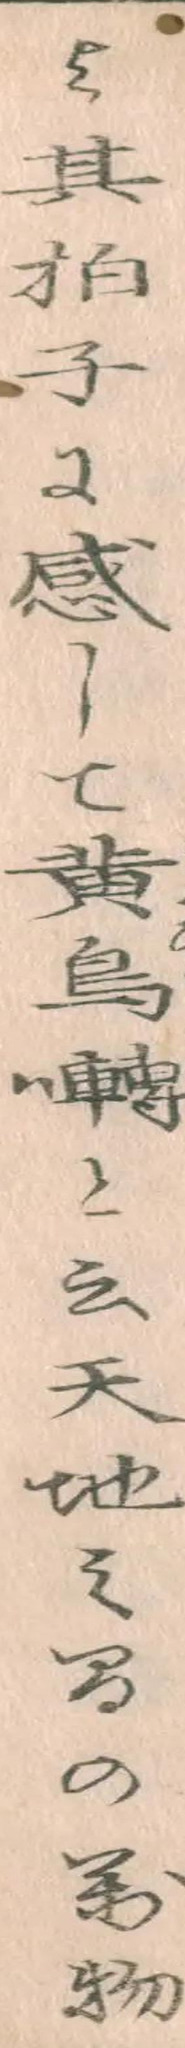は其拍子に感して黄鳥囀と云天地之間の万物
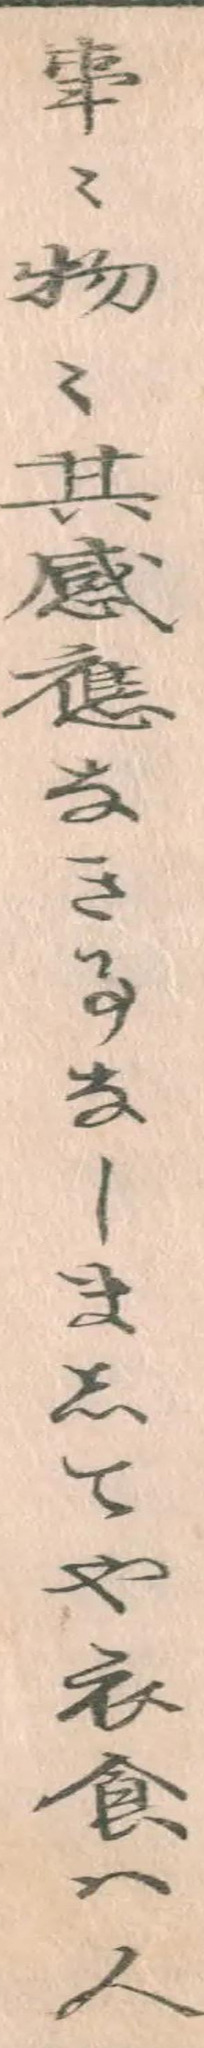事々物々其感応なき事なしましてや衣食は人
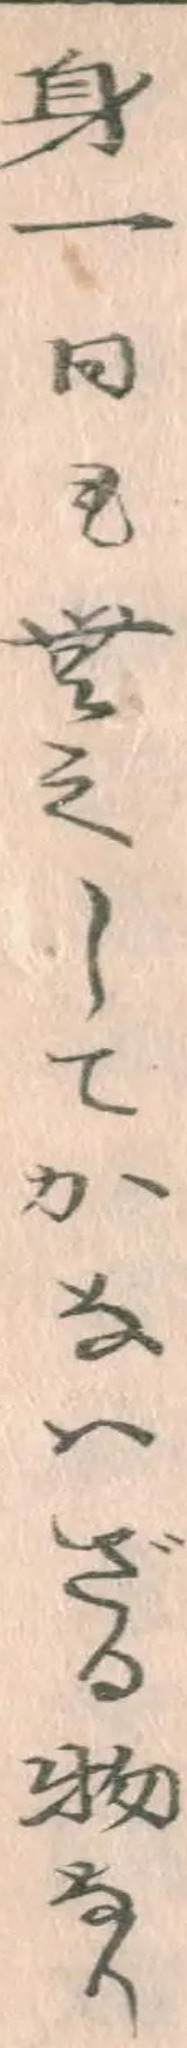身一日も無之してかなはざる物なり
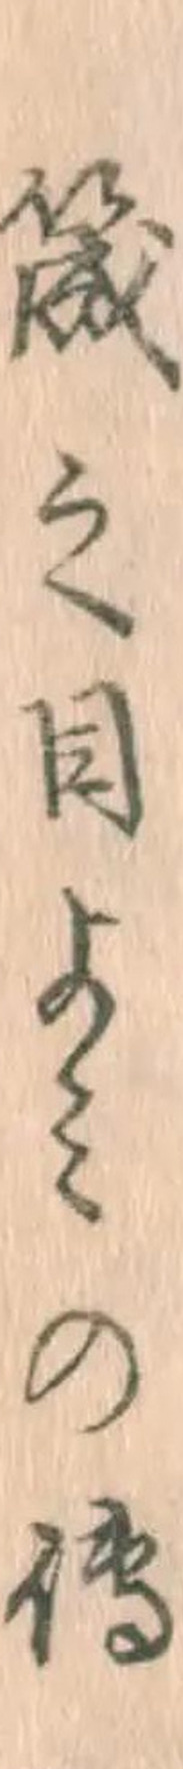筬之目よみの伝
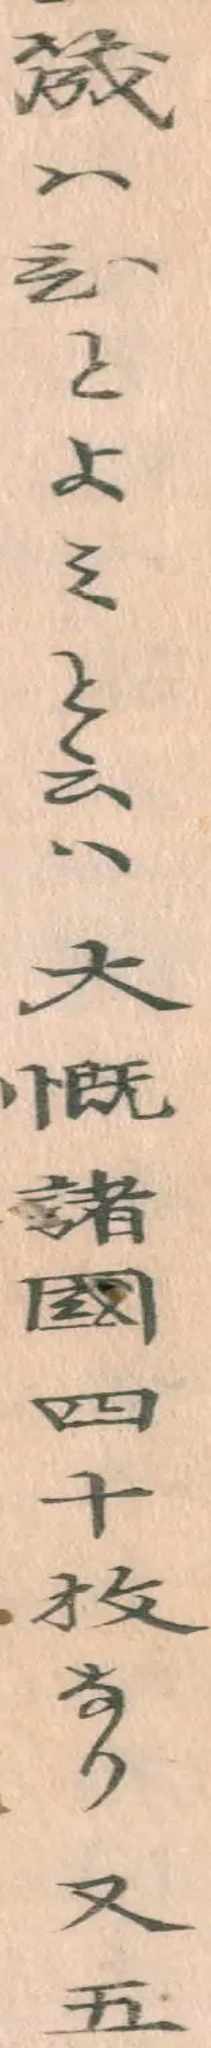一筬はひとよみと云は大慨諸国四十枚なり又五
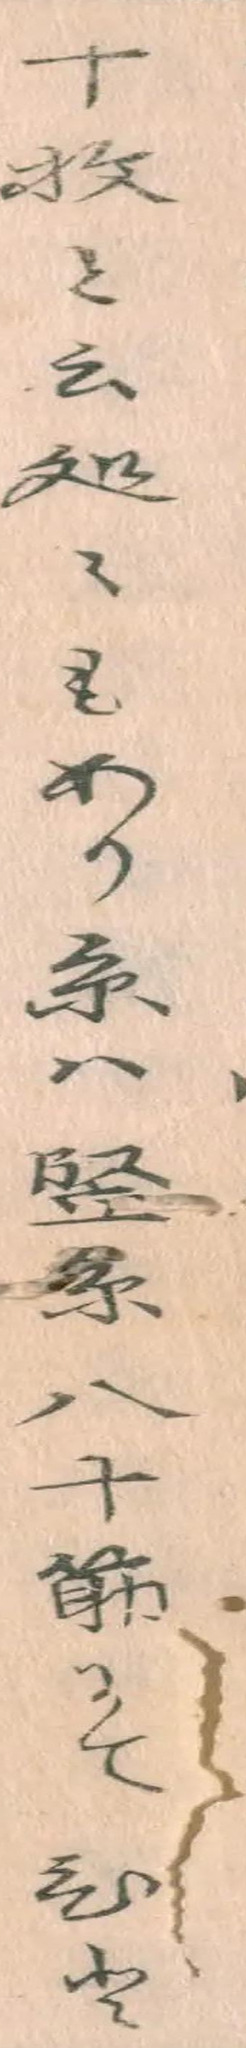十枚と云処々もあり糸は竪糸八十筋にてひと
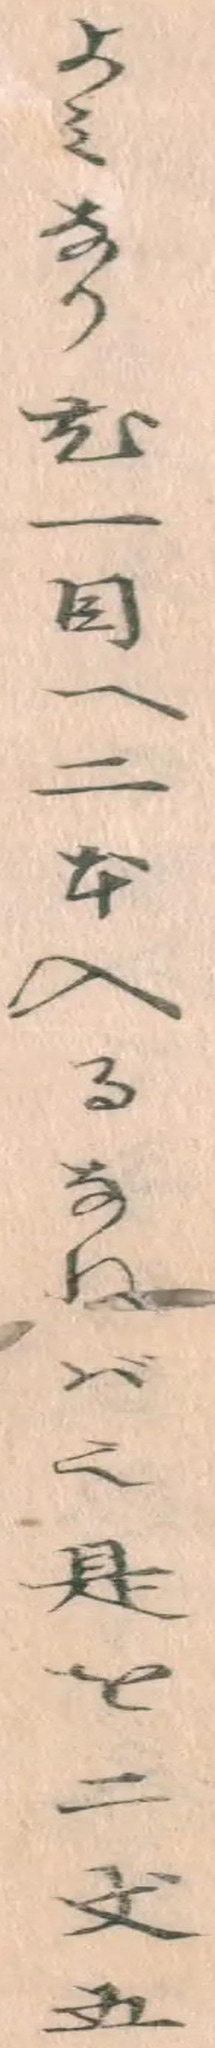よみなり尤一目へ二本入るなれば也是を二丈五
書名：機織彙編 5巻. [2]
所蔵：国立国会図書館 National Diet Library, JAPAN
